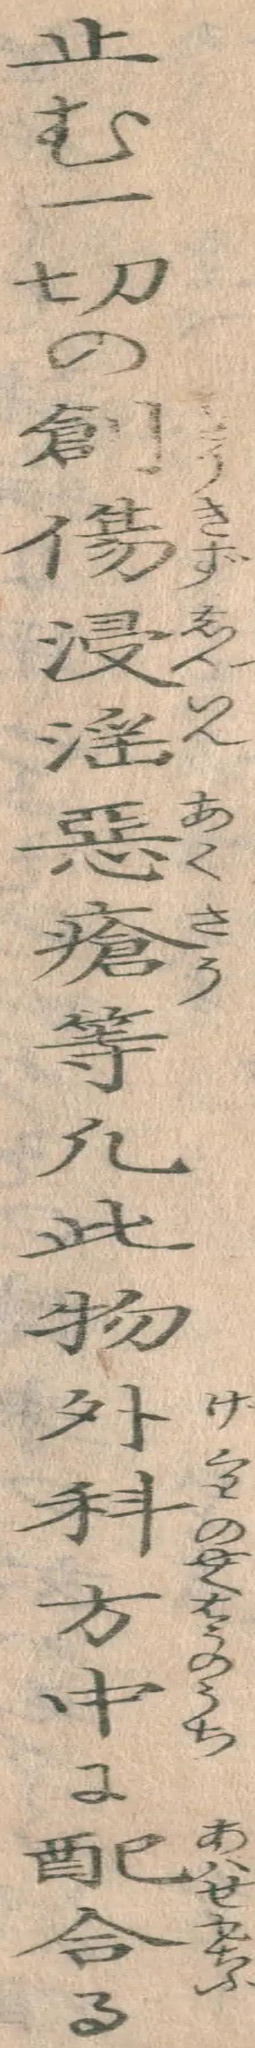止む一切の創傷浸淫悪瘡等凡此物外科方中に配合る
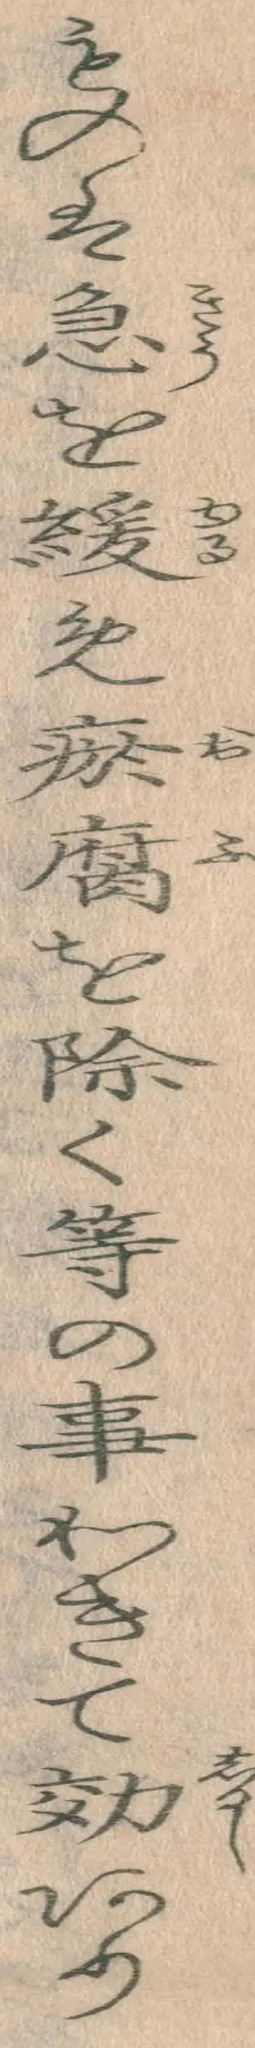ものは急を緩め瘀腐を除く等の事わきて効あり
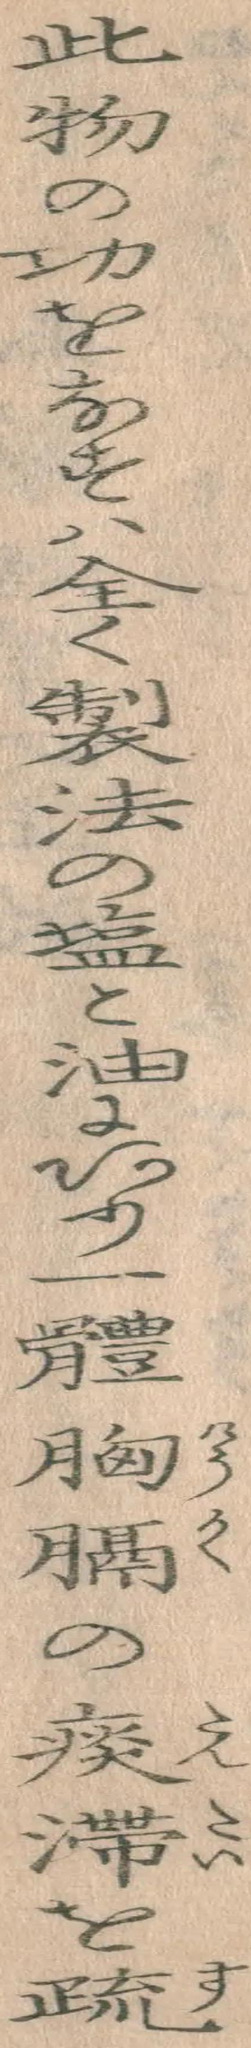此物の功をなすは全く製法の塩と油にあり一体胸膈の痰滞を疏
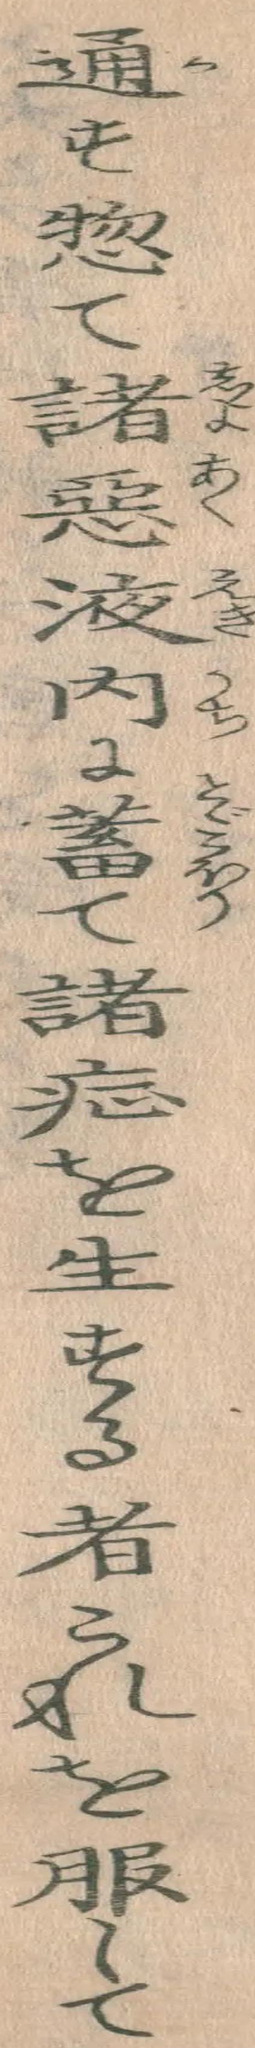通す惣て諸悪液内に蓄て諸症を生する者これを服して
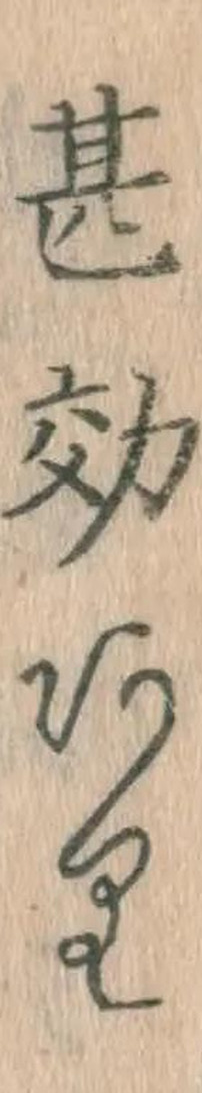甚効あり
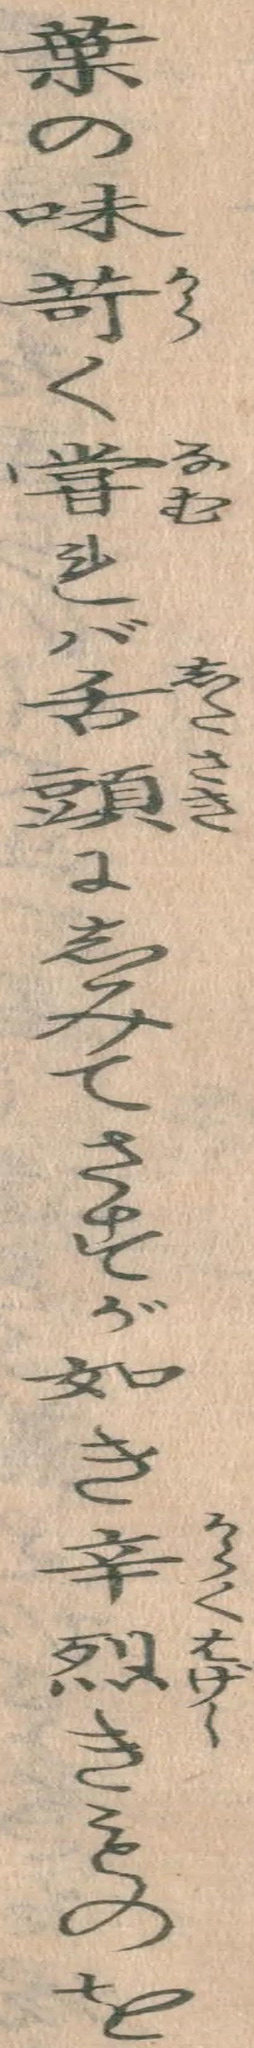葉の味苛く嘗れば舌頭にしみてさすが如き辛烈きものを
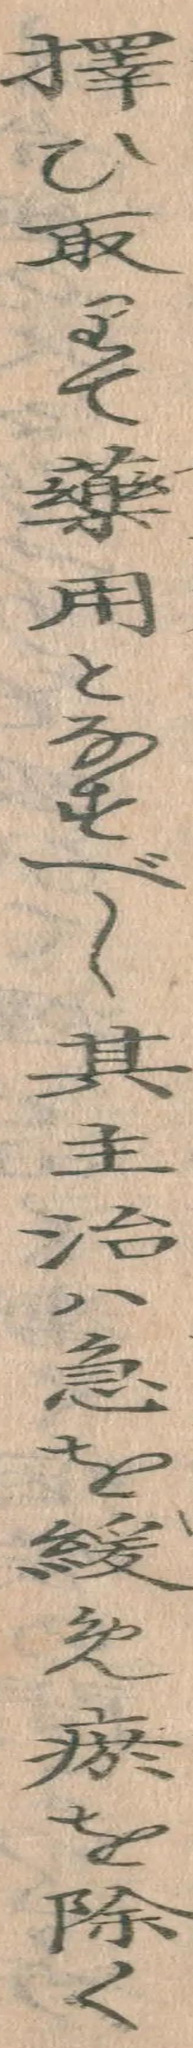択ひ取りて薬用となすべし其主治は急を緩め瘀を除く
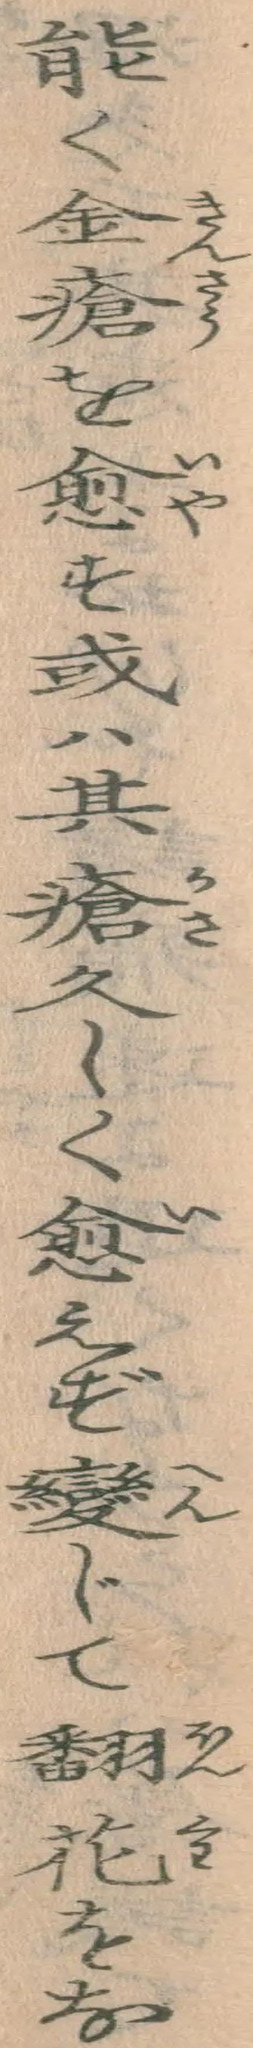能く金瘡を愈す或は其瘡久しく愈えず変じて翻花をな
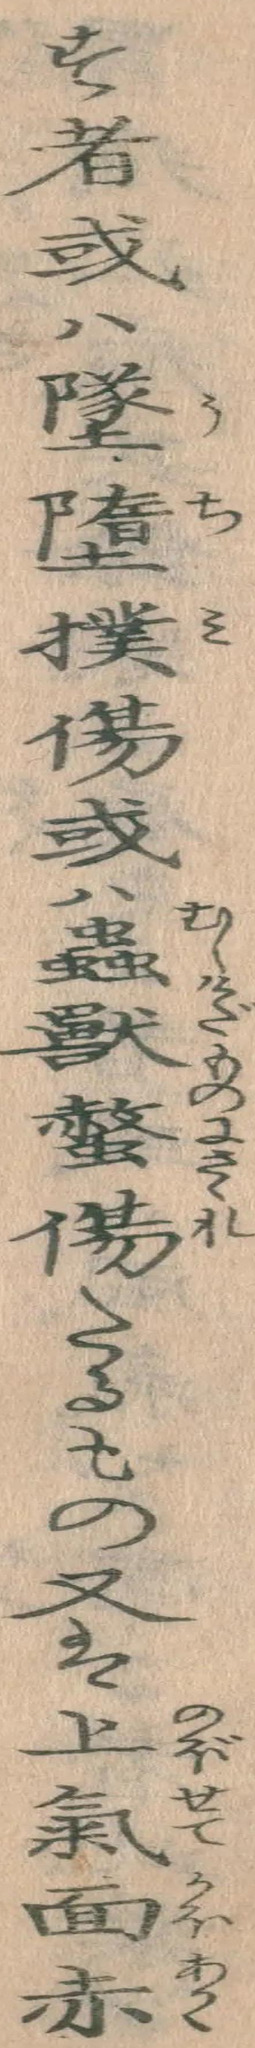す者或は墜堕撲傷或は虫獣螫傷たるもの又は上気面赤
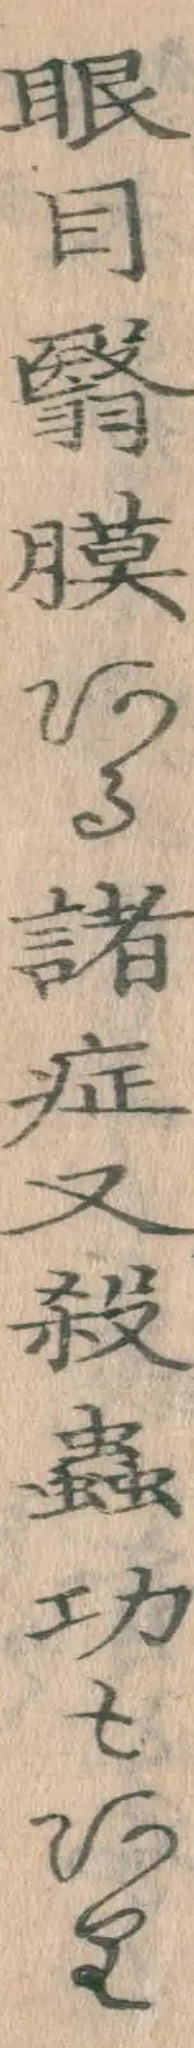眼目翳膜ある諸症又殺虫功もあり
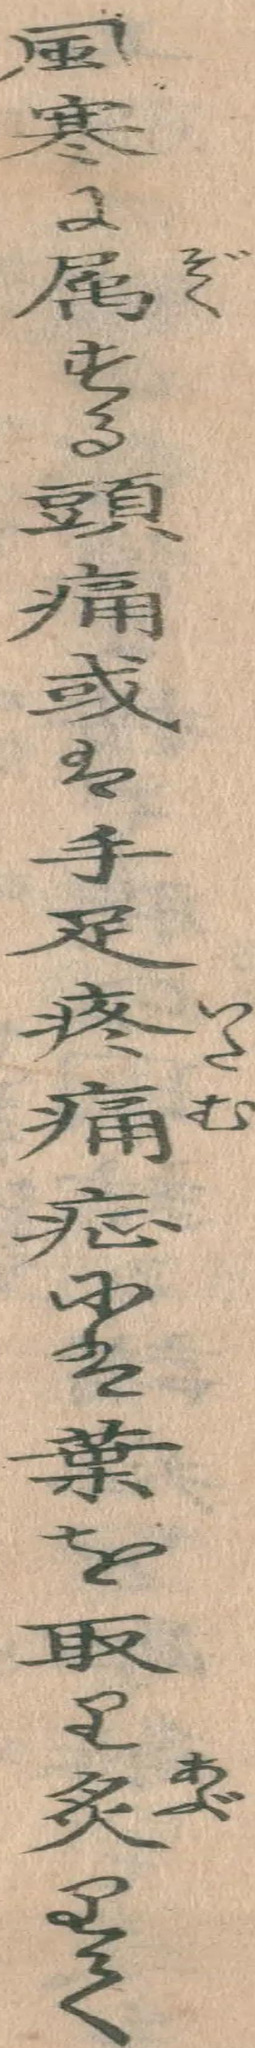風寒に属する頭痛或は手足疼痛症には葉を取り炙りて
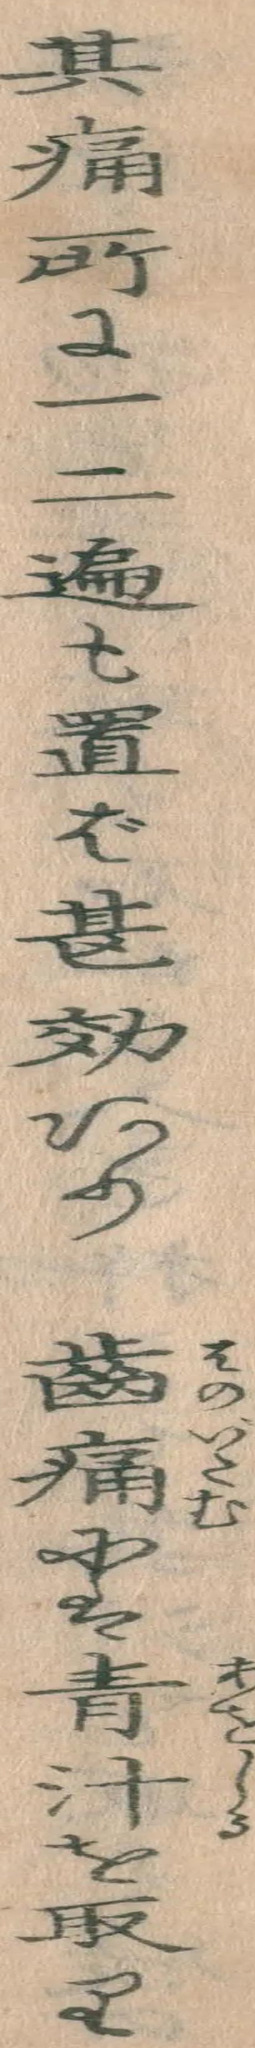其痛所に一二遍も置ば甚効あり歯痛には青汁を取り
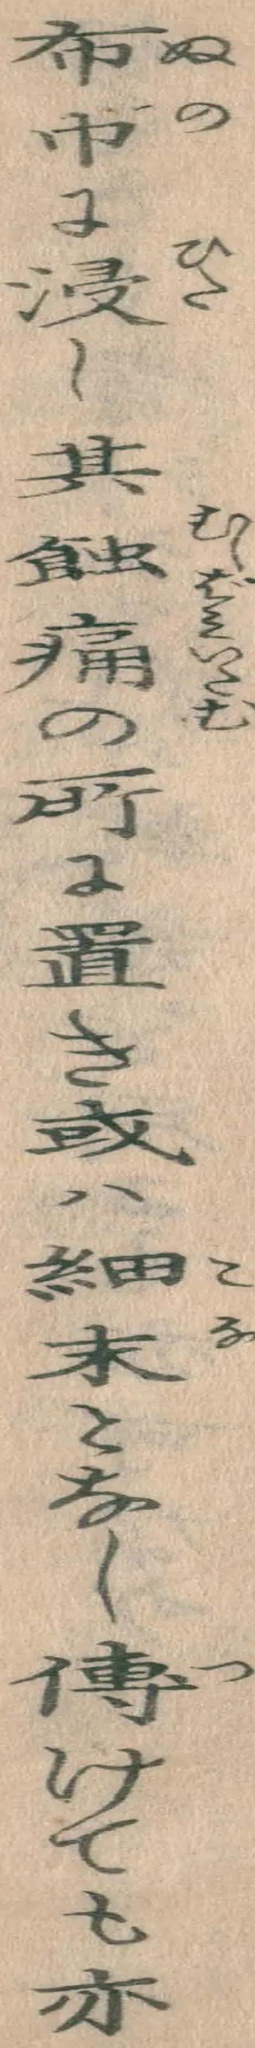布巾に浸し其蝕痛の所に置き或は細末となし傅けても亦
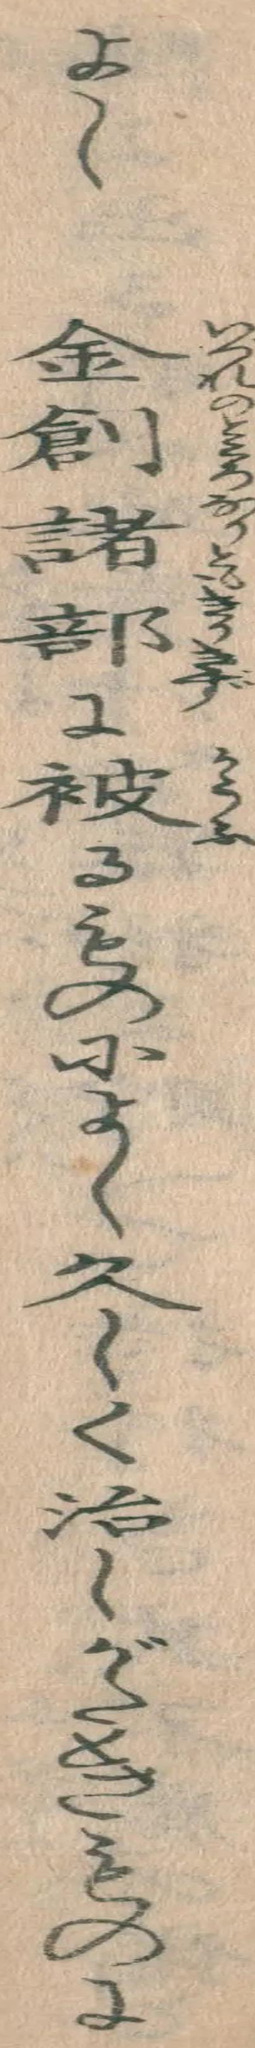よし金創諸部に被るものによし久しく治しがたきものに
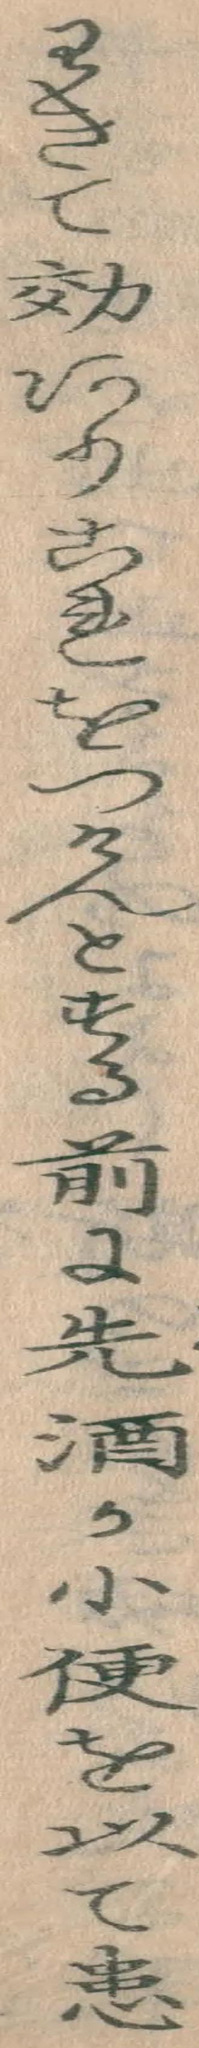わきて効ありこれをつけんとする前に先酒か小便を以て患
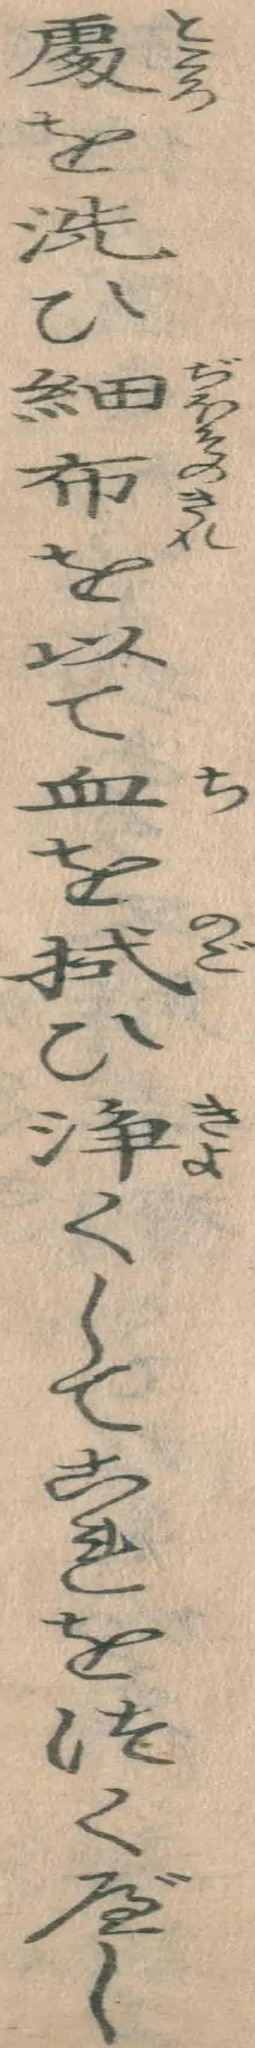処を洗ひ細布を以て血を拭ひ浄くしてこれをつくべし
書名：目さまし草
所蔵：国立国会図書館 National Diet Library, JAPAN
